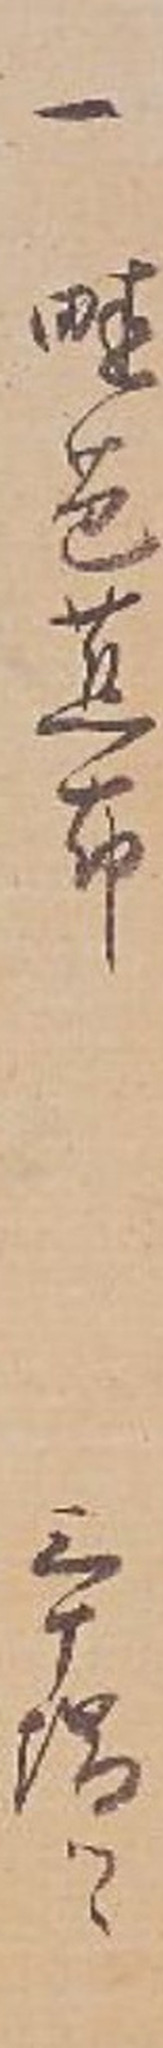一畦芭蕉布三十端ツヽ
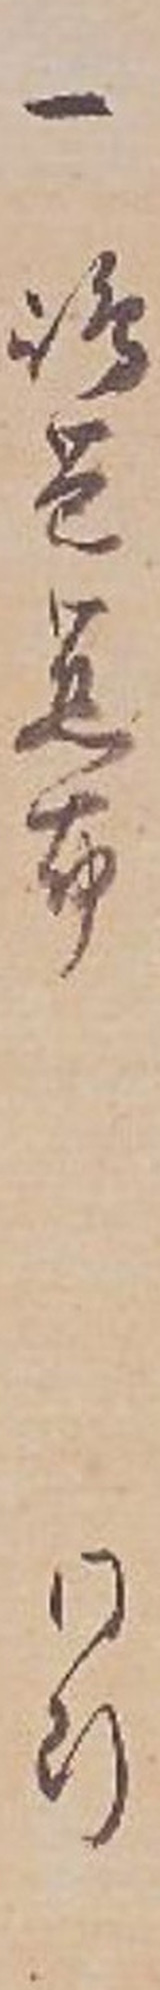一島芭蕉布同断
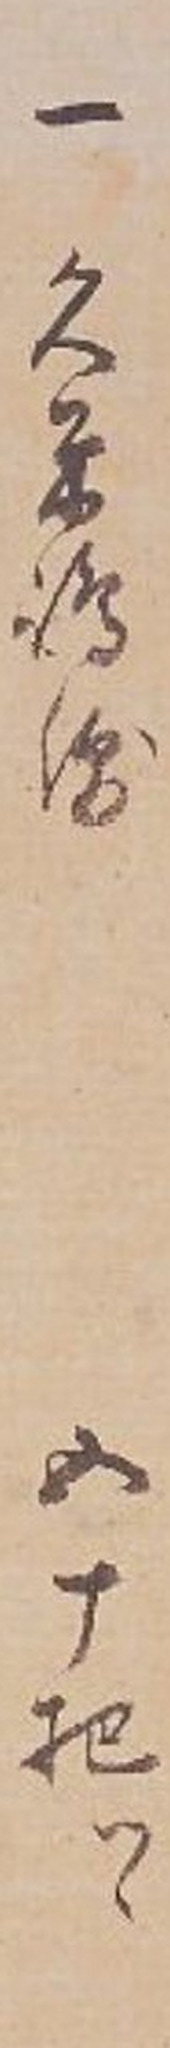一久米島綿五十把ツヽ
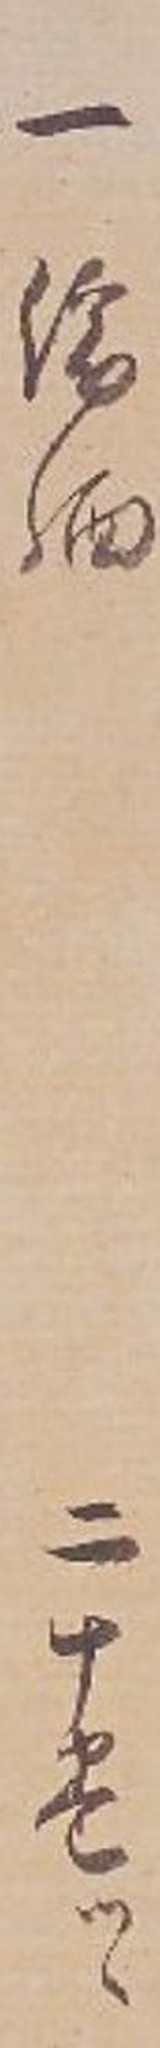一縮緬二十巻ツヽ
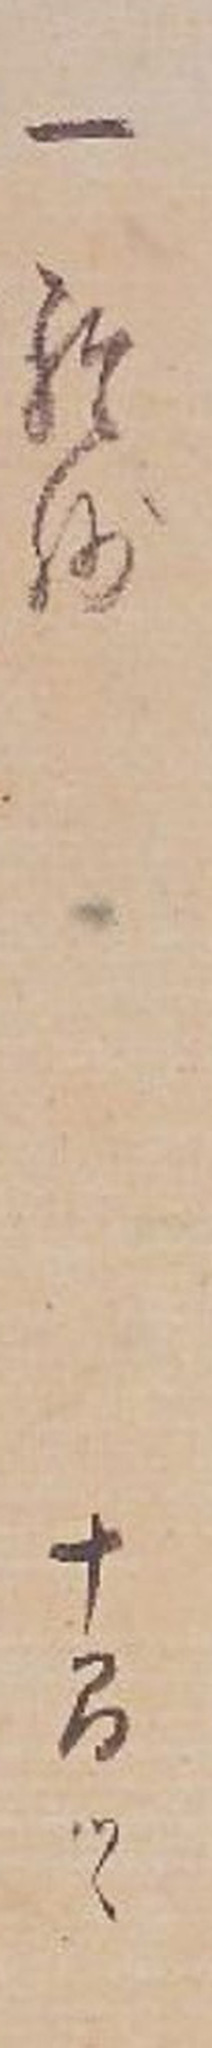一羅紗十間ツヽ
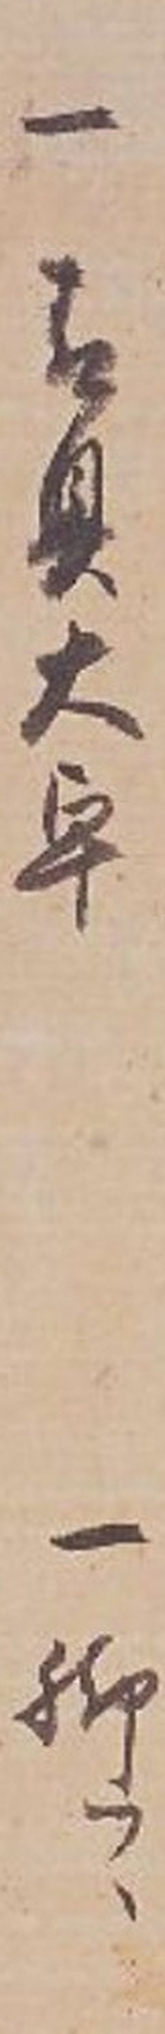一青貝大卓一脚ツヽ
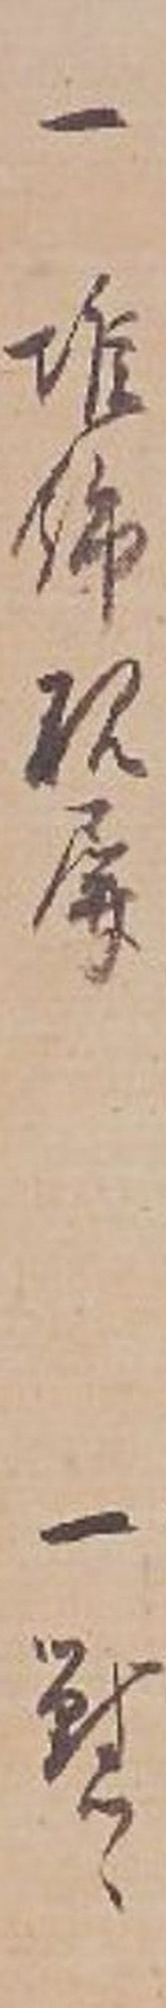一堆綿硯屏一対ツヽ

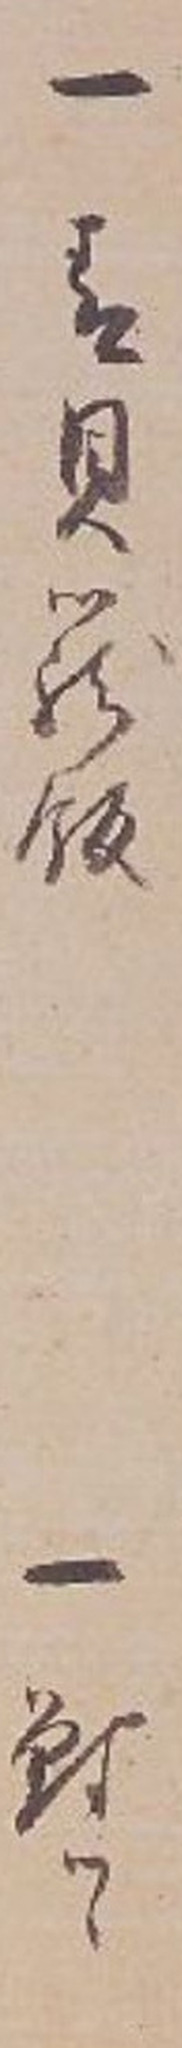一青貝籠飯一対ツヽ
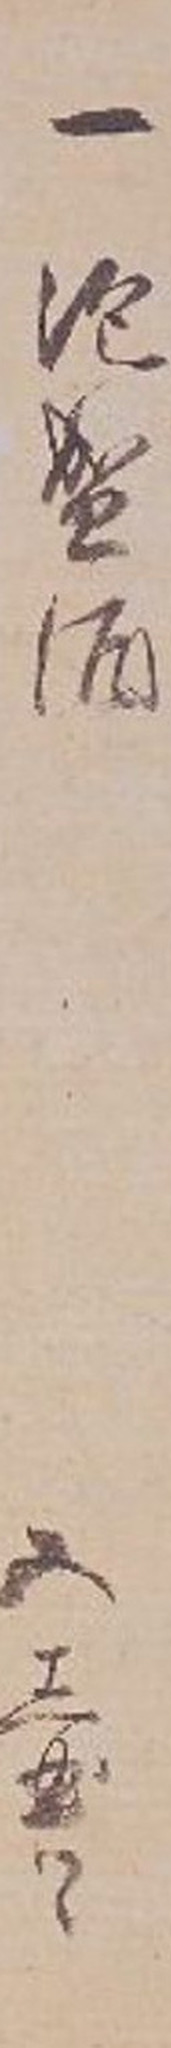一泡盛酒五壺ツヽ
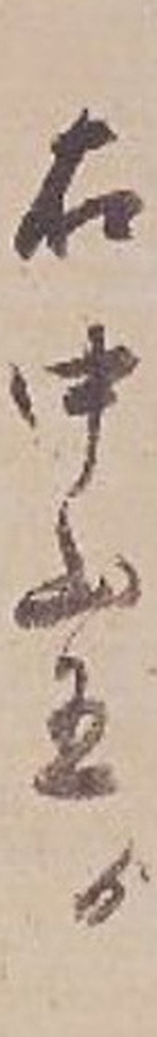右中山王ゟ
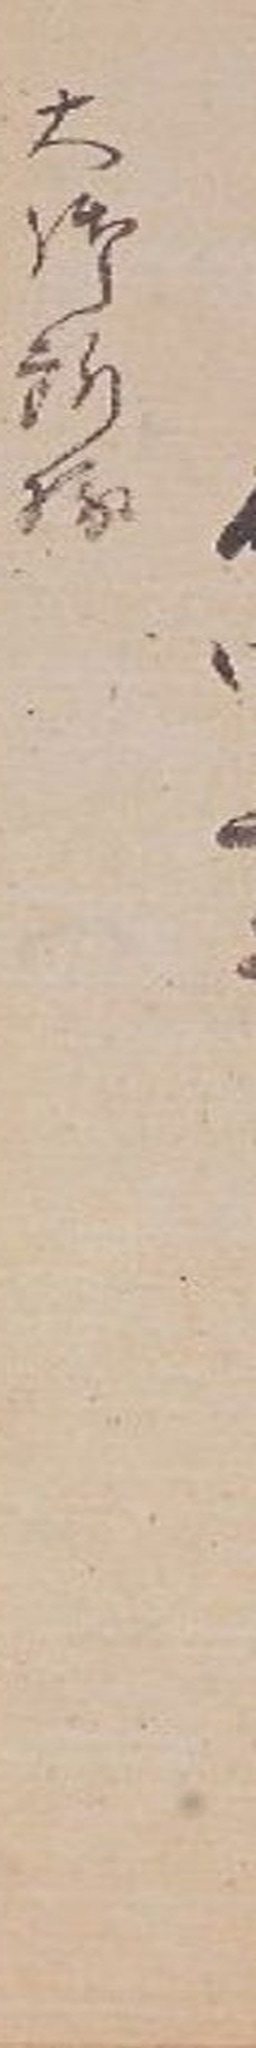大御所様
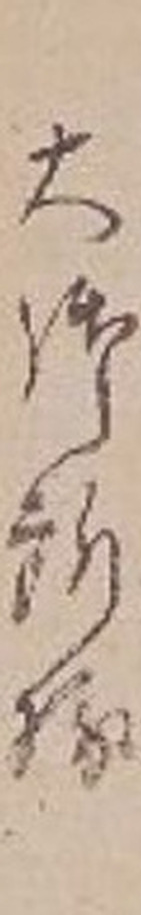大御所様
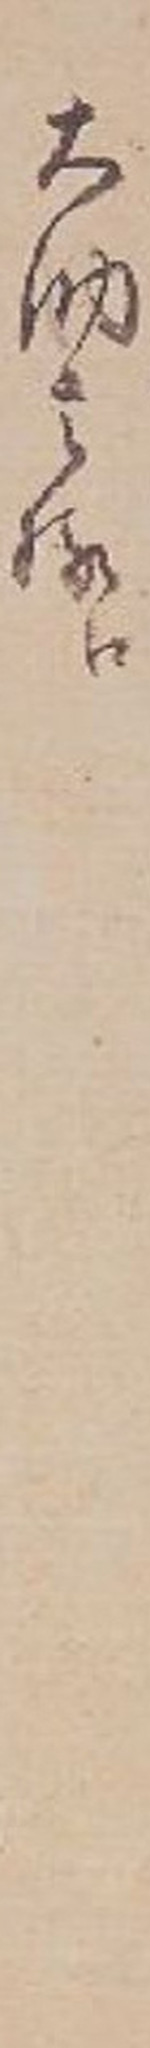大納言様え
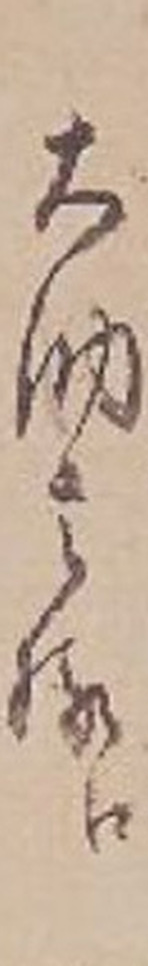大納言様え
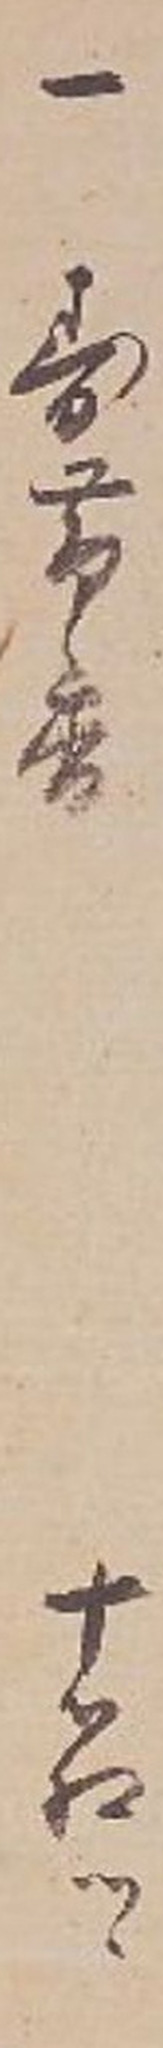一寿帯香十箱ツヽ
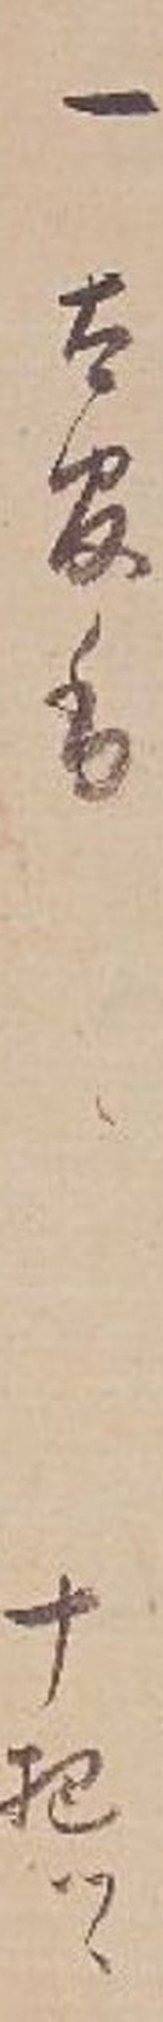一太官香十把ツヽ
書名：琉球人来朝記 五、六、七
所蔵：University of the Ryukyus Library
